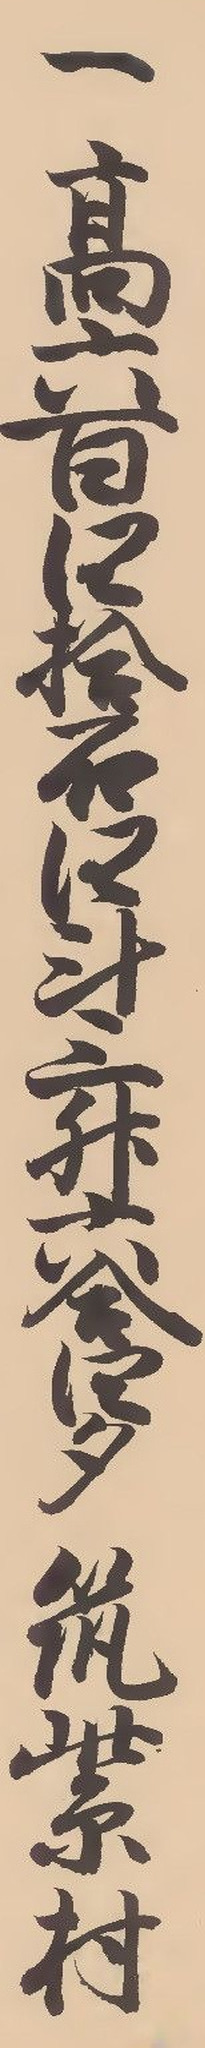一高六百四拾石四斗三升六合四勺筑紫村

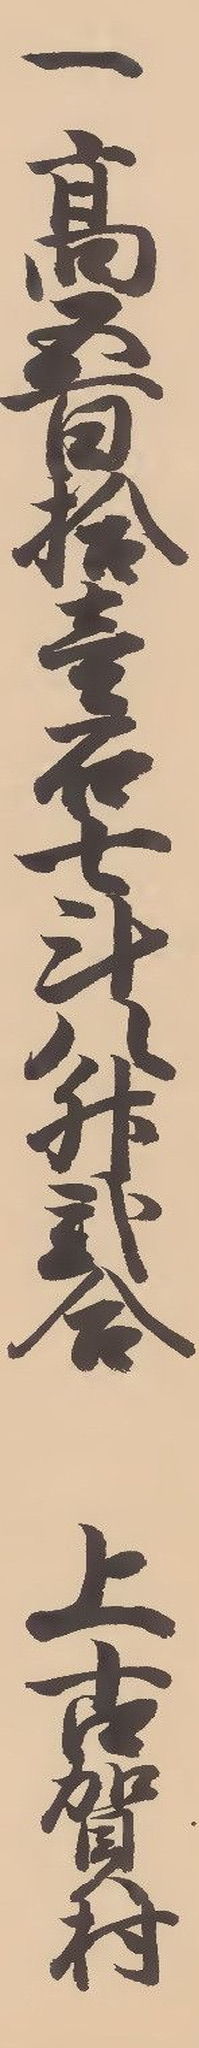一高五百拾壱石七斗八升弐合上古賀村
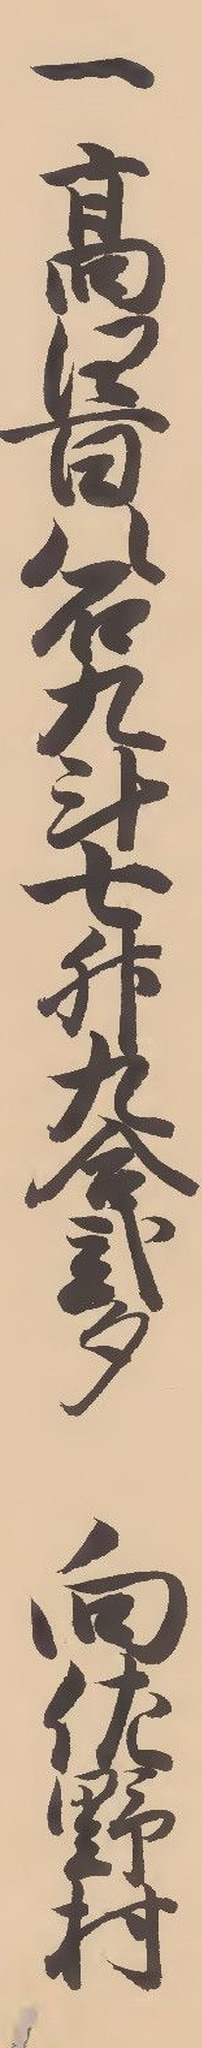一高四百八石九斗七升九合弐勺向佐野村
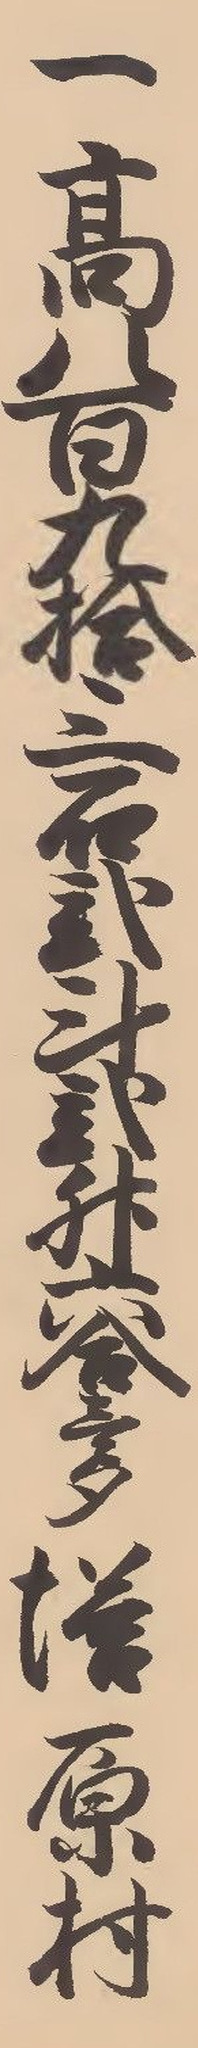一高八百九拾三石弐斗弐升六合壱勺塔原村
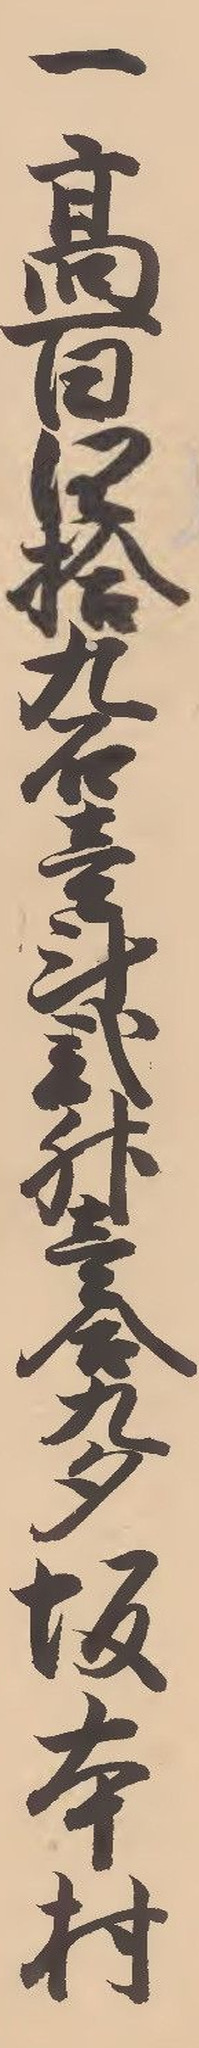一高百四拾九石壱斗弐升壱合九勺坂本村
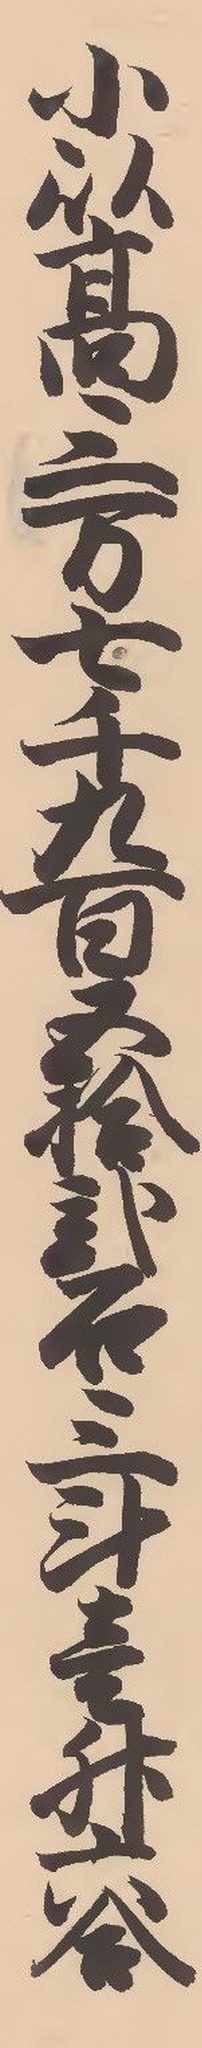小以高三万七千九百五拾弐石三斗壱升六合

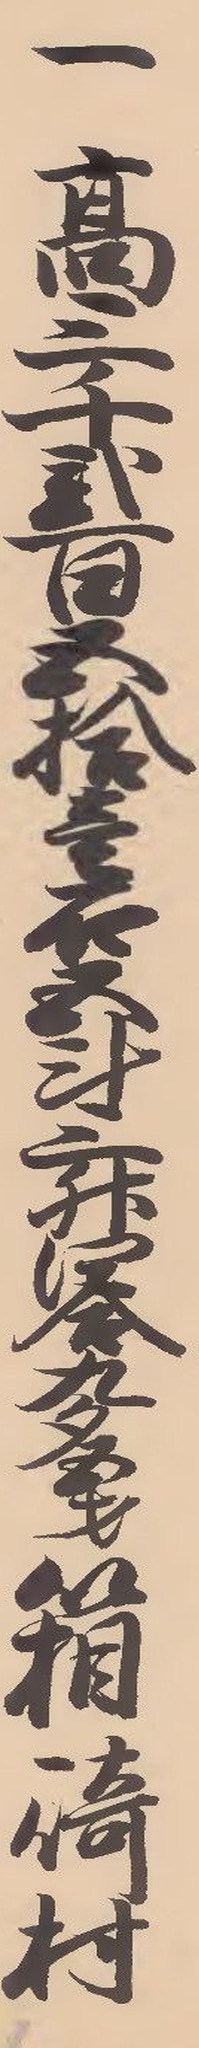一高三千弐百五拾壱石五斗三升四合九勺五才箱崎村
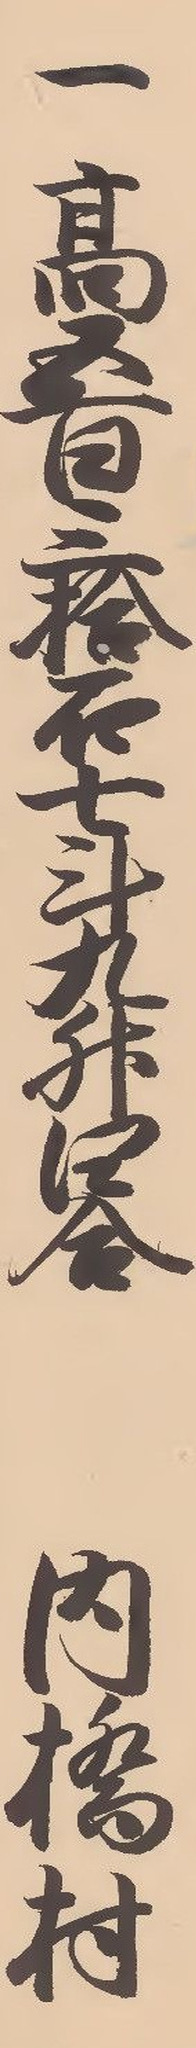一高五百三拾石七斗九升四合内橋村
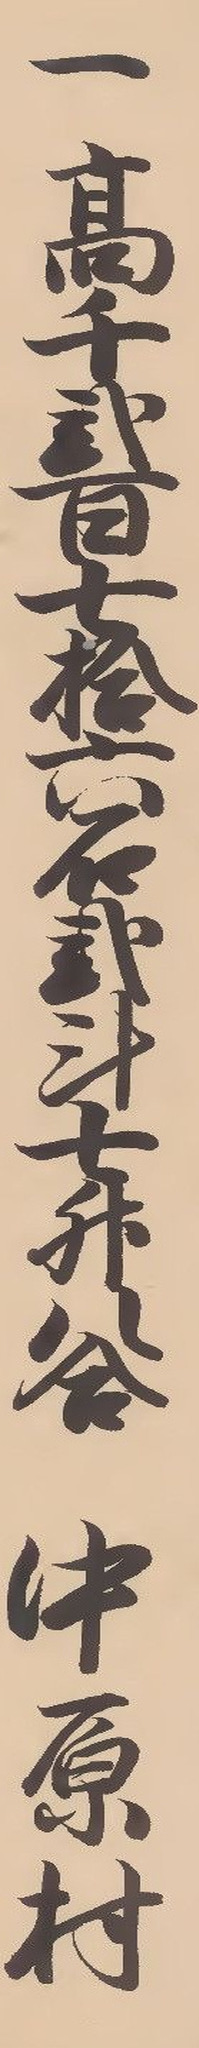一高千弐百七拾六石弐斗七升八合中原村

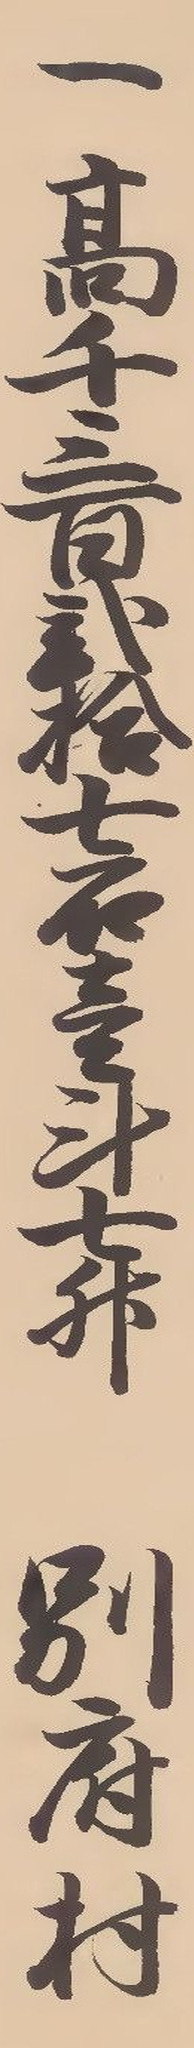一高千三百弐拾七石壱斗七升別府村
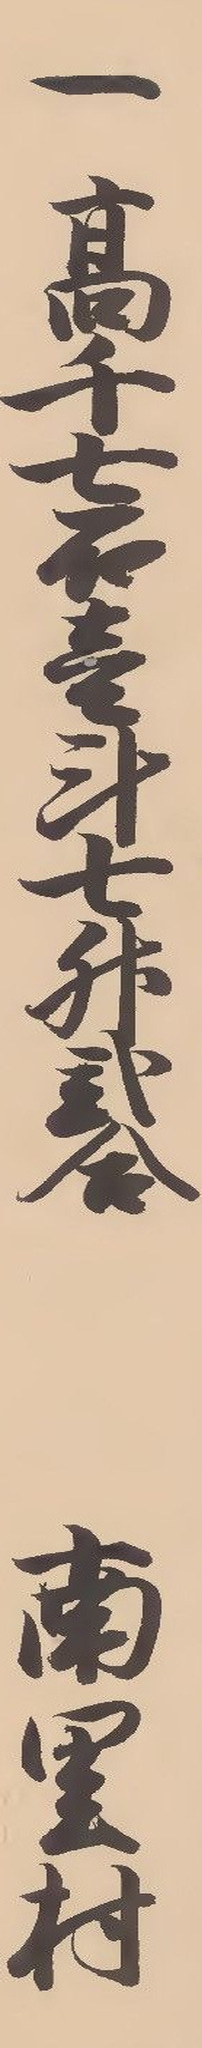一高千七石壱斗七升弐合南里村
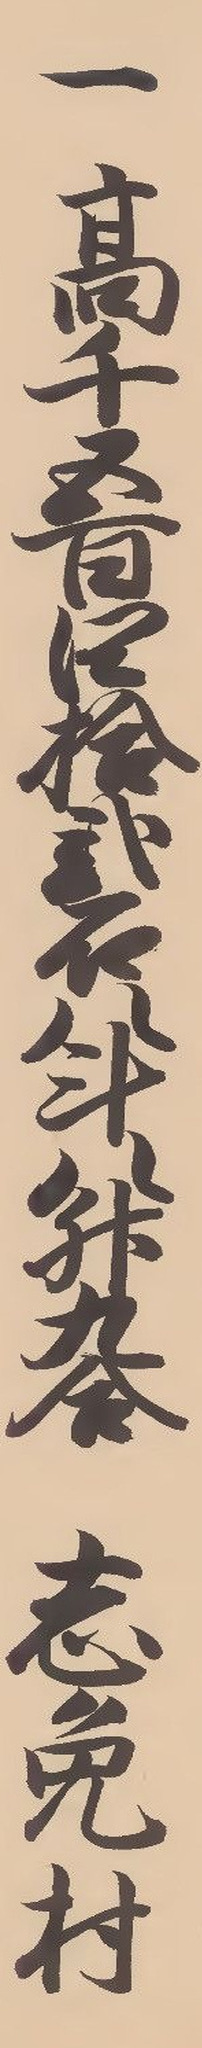一高千五百四拾弐石八斗八升九合志免村
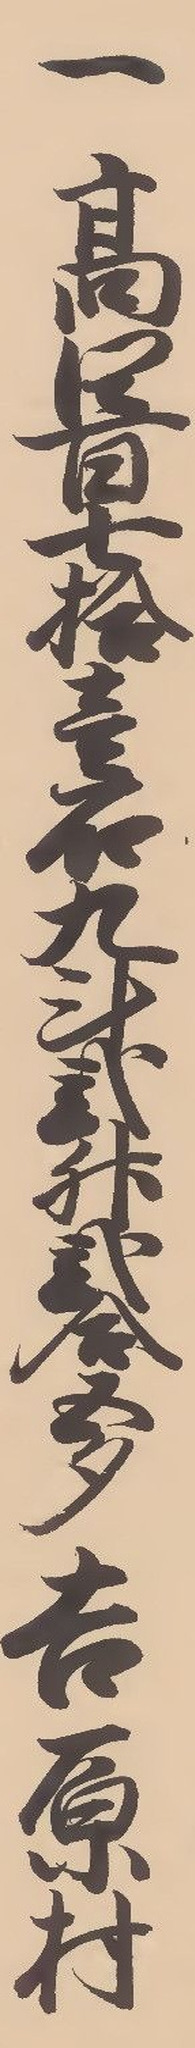一高四百七拾壱石九斗弐升弐合五勺吉原村
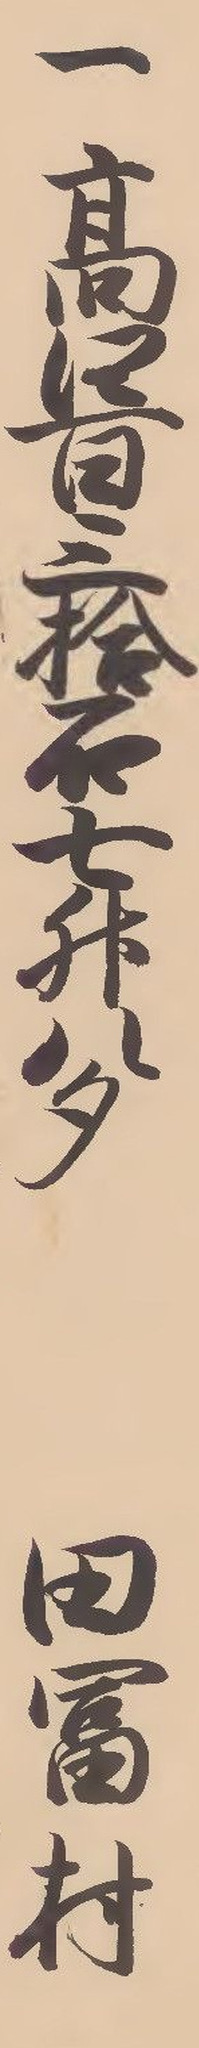一高四百三拾石七升八勺田富村

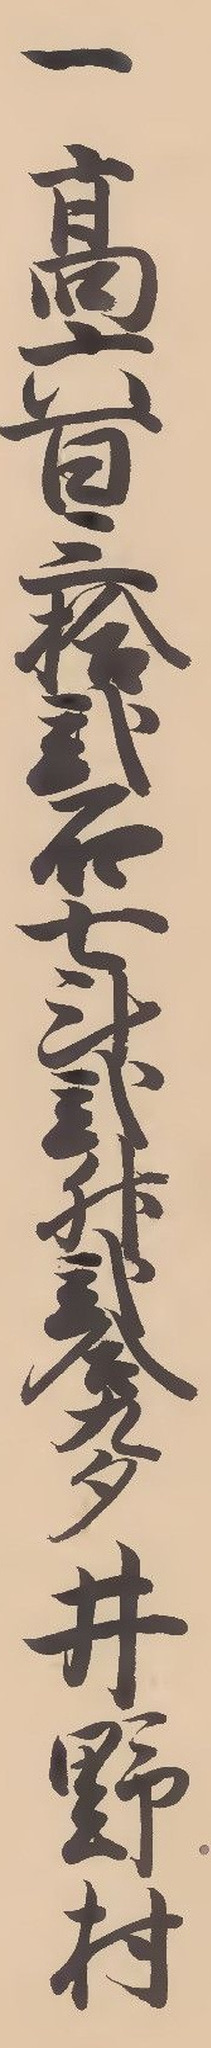一高六百三拾弐石七斗弐升弐合九勺井野村
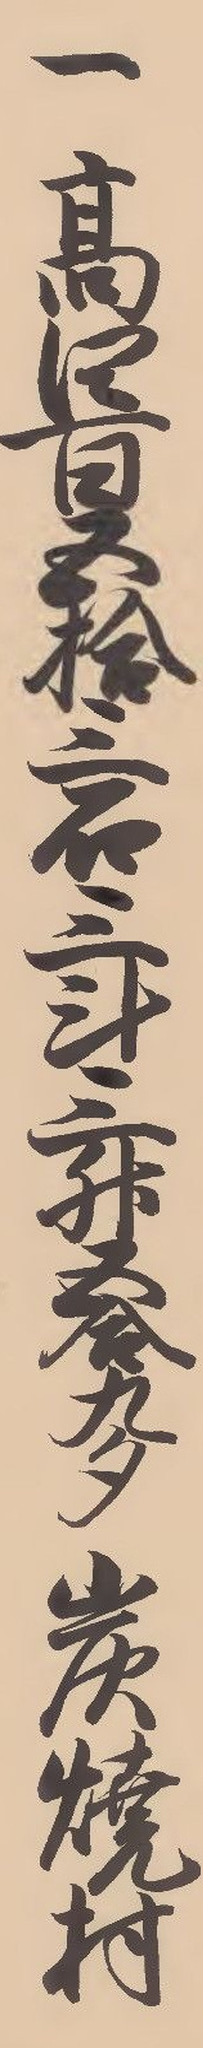一高四百五拾三石三斗三升五合九勺炭焼村
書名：筑前国郷帳
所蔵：国立公文書館 National Archives of Japan
